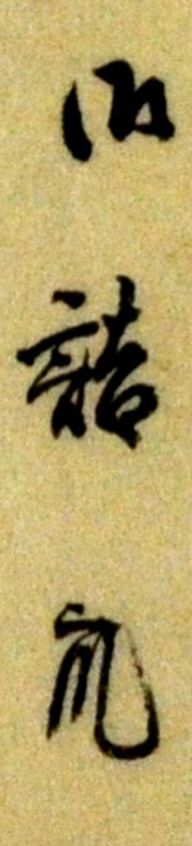御諸衆
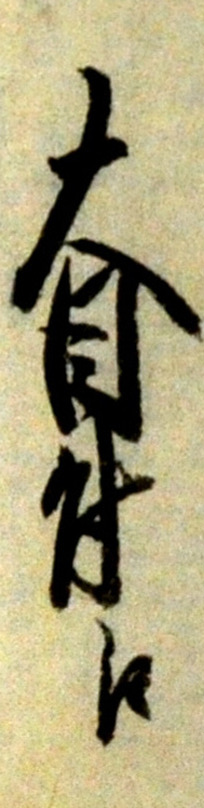大目付え

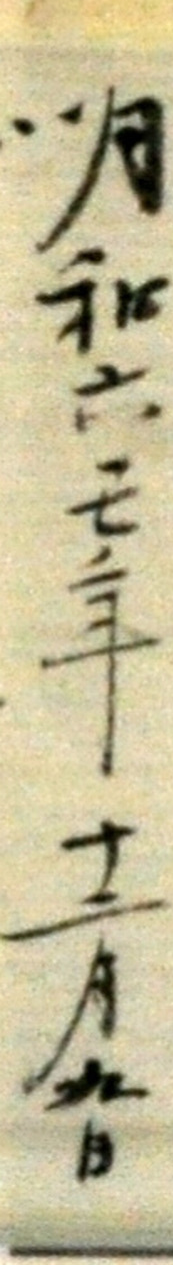明和六丑年十二月九日
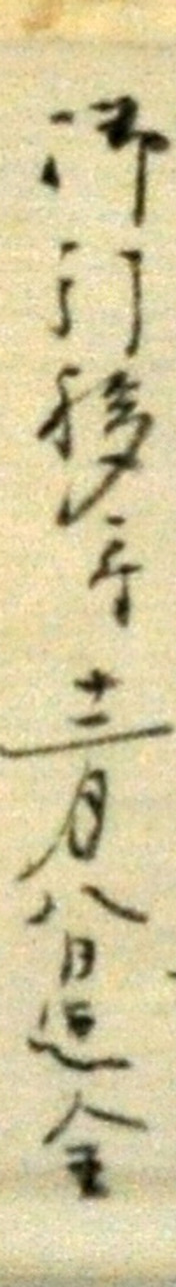御引移に付十二月八日迄全
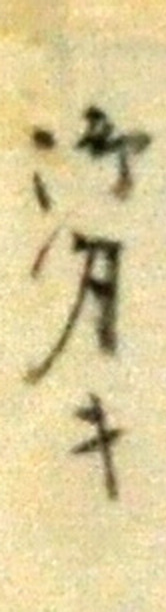御明キ
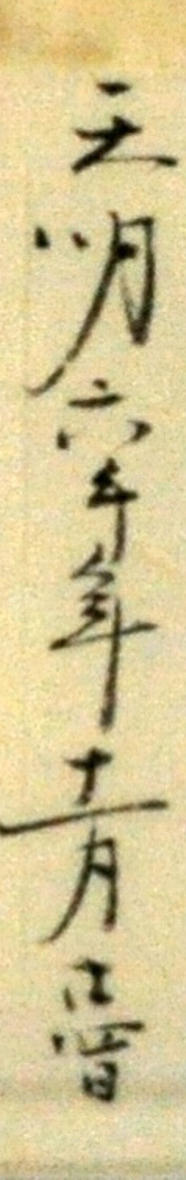天明六午年十一月廿四日
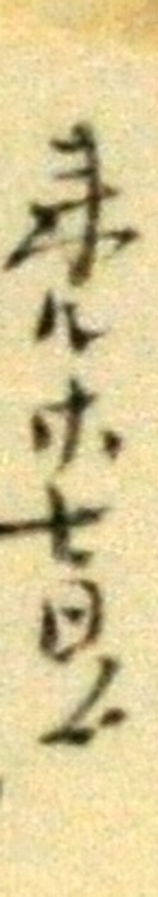来ル廿七日ゟ
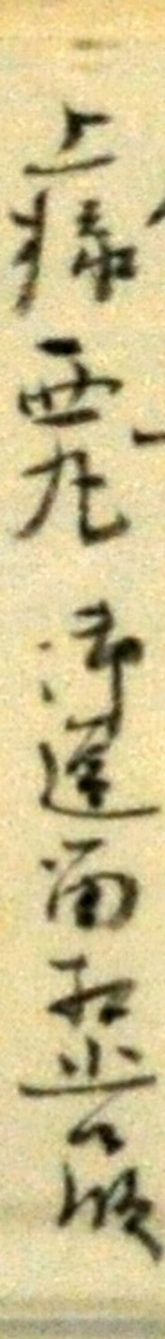上様西丸御逗留相止候段
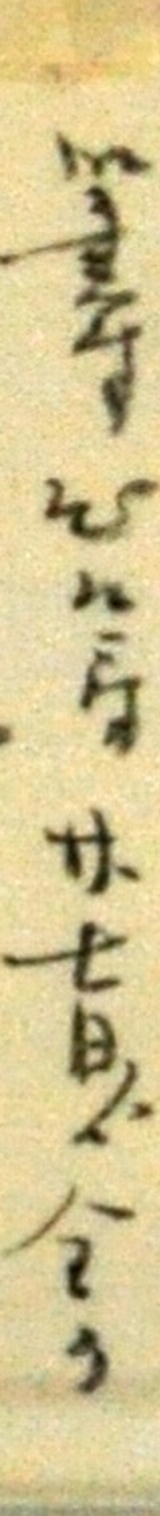以書付出候に付廿七日ゟ全て
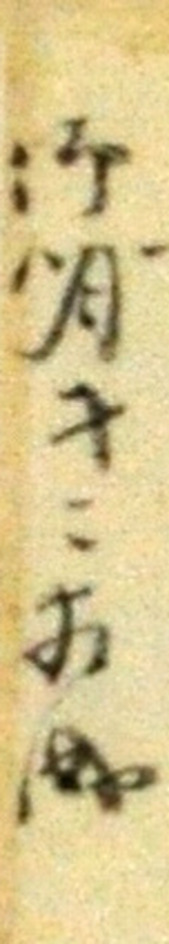御明キに相成
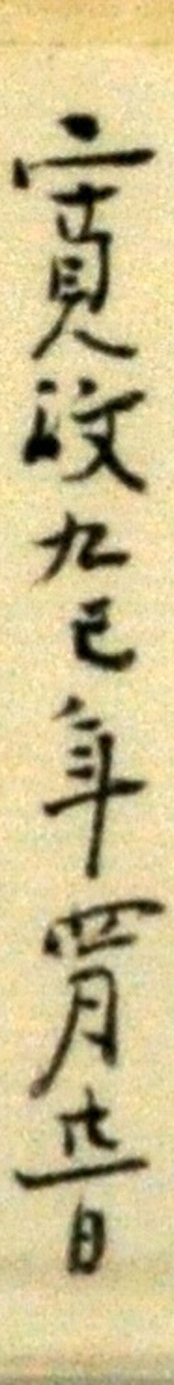寛政九巳年四月廿一日
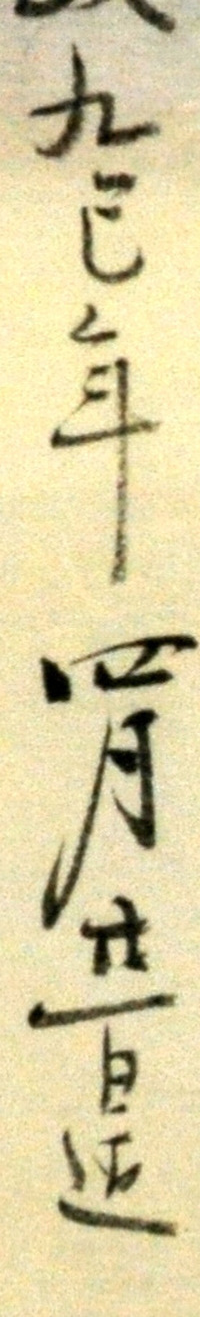寛政九巳年四月廿一日
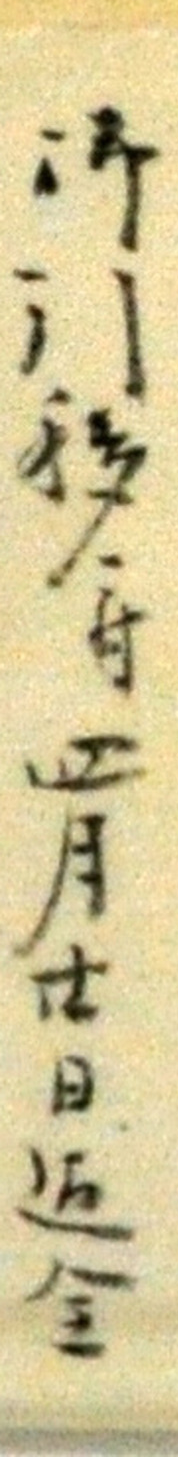御引移に付四月廿日迄全
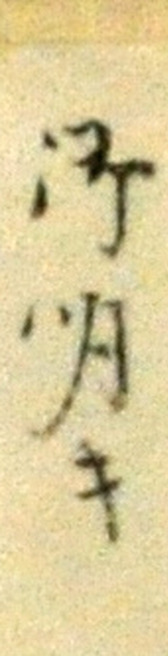御明キ

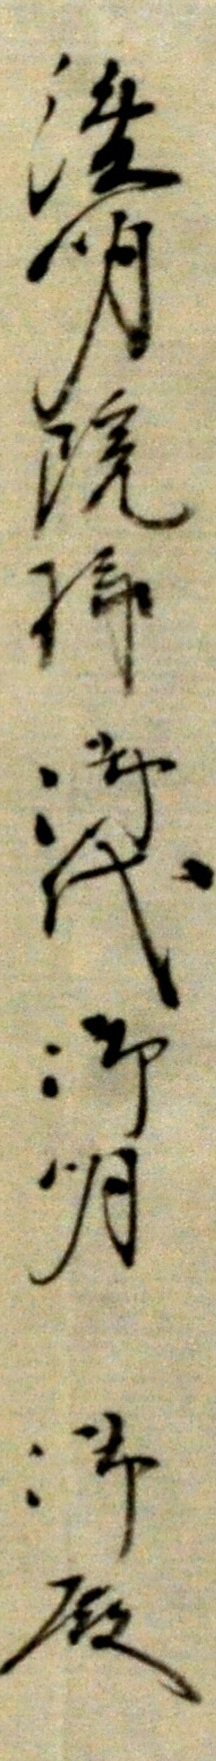浚明院様御代御明御殿
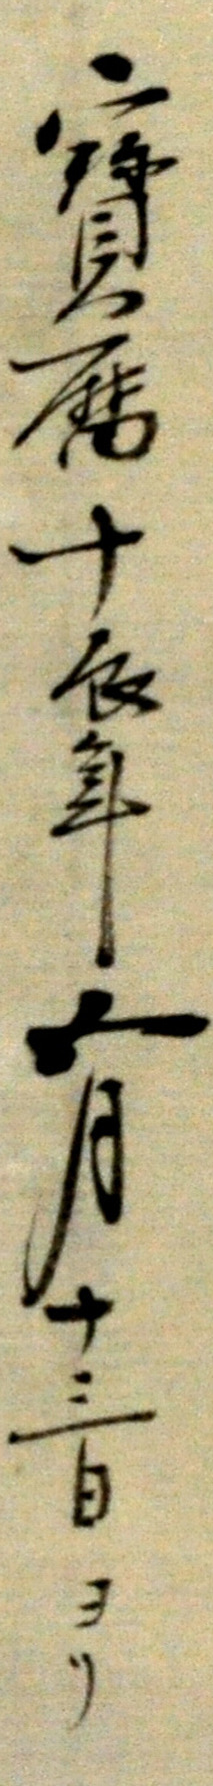宝暦十辰年五月十三日ヨリ
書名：申合帳〔一括〕
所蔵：伊那市立高遠町図書館・合同会社AMANE
